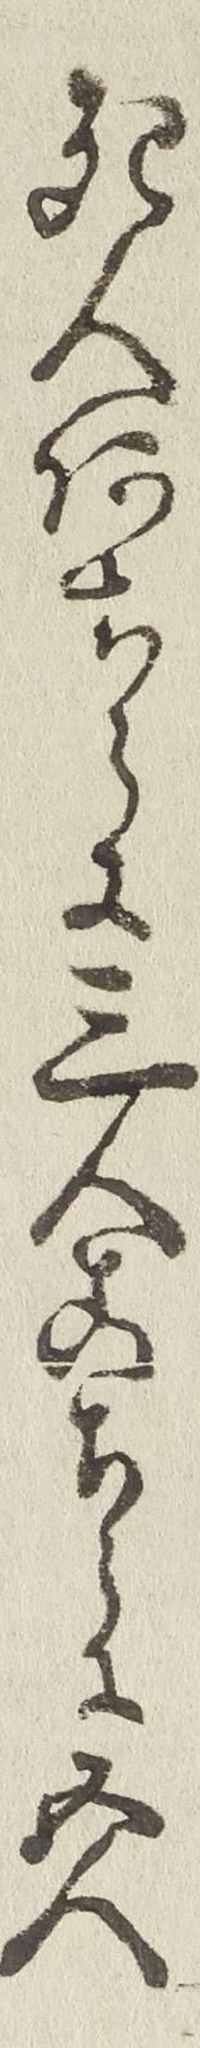死人あちらに三人こちらに五人
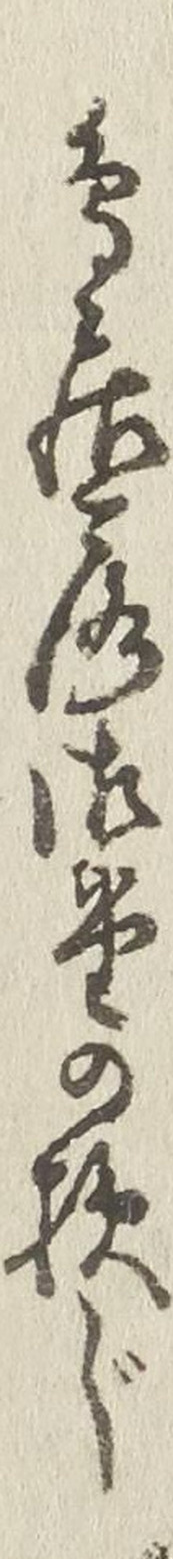鳥居落御堂の損じ
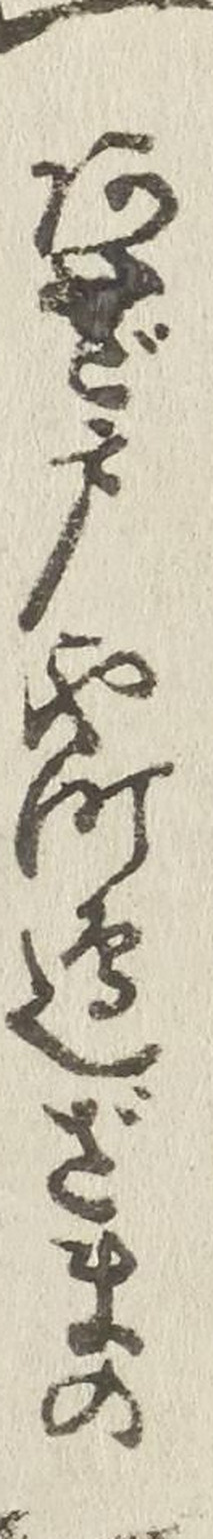阿ハざ戸や町辺ざまの
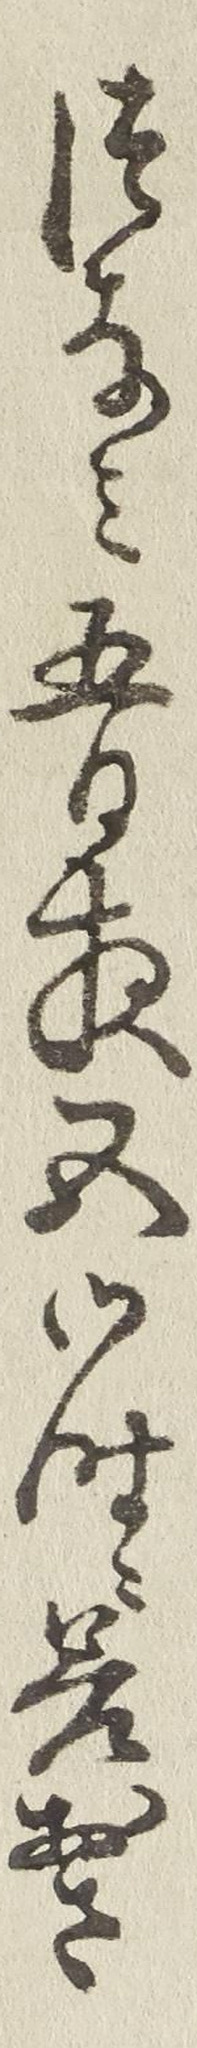つなみ五日夜五ツ時に差おさ
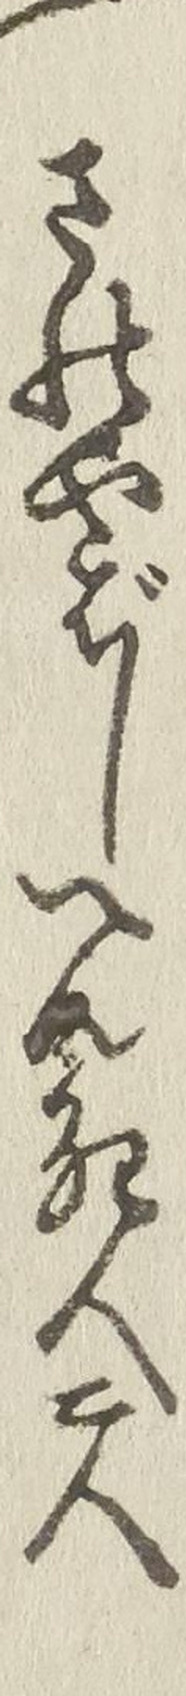さのやばしへん死人二人
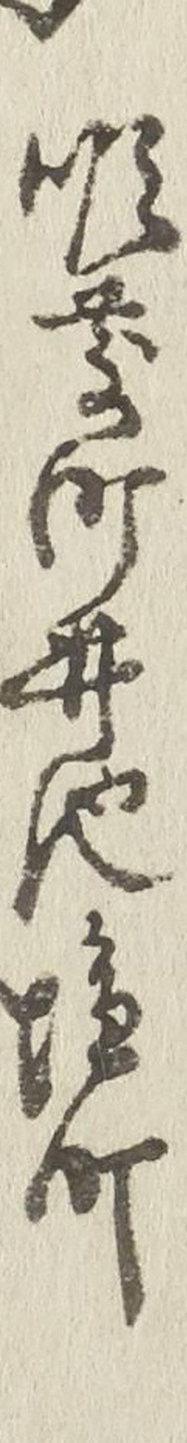順慶町丼池塩町
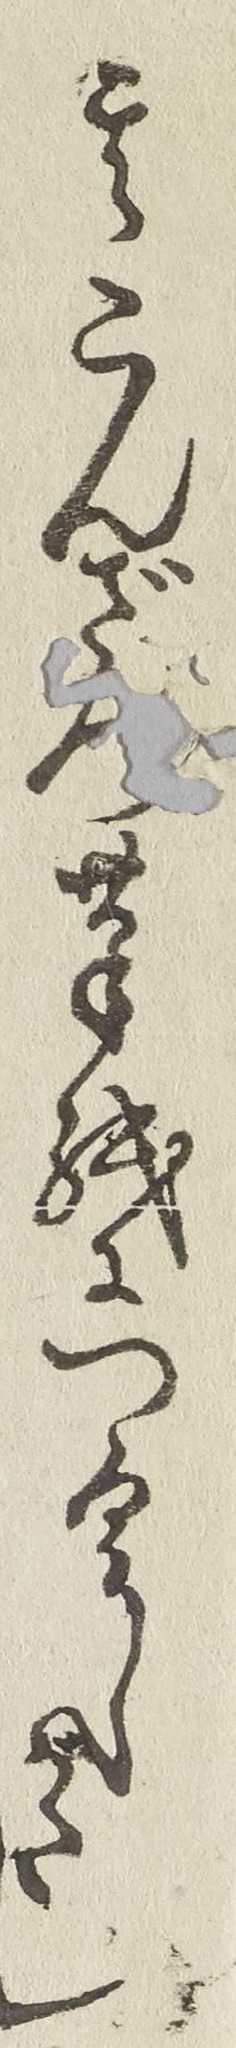其こんざつ筆紙につくしがたし
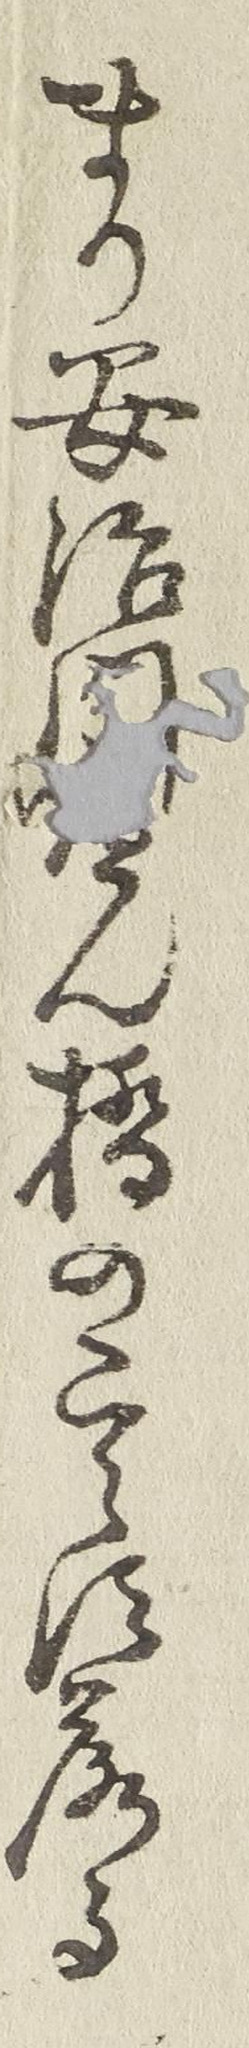まり安治川ん橋のこらす落る
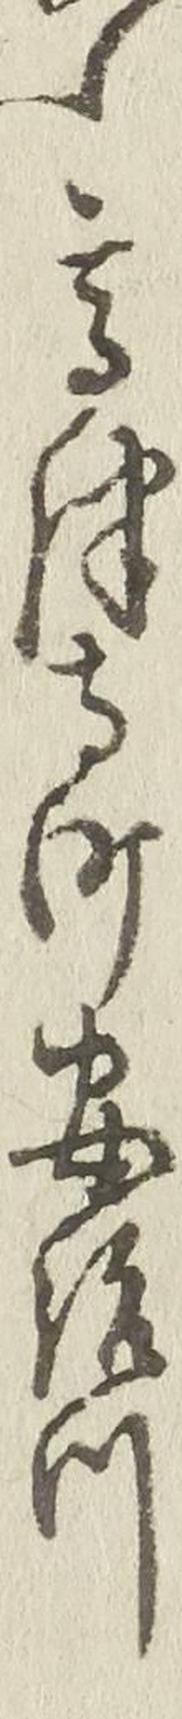高津寺町安治川
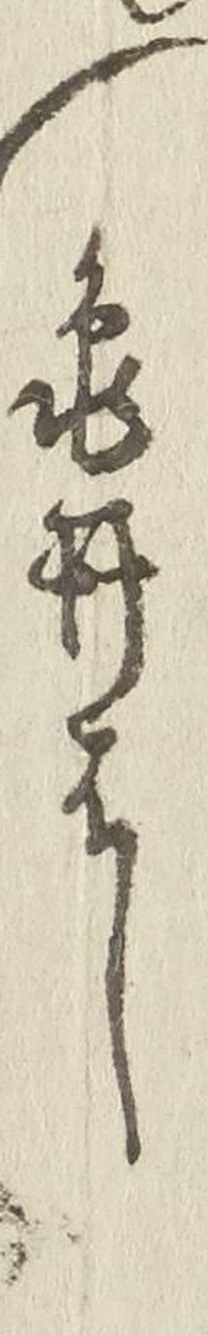亀井はし
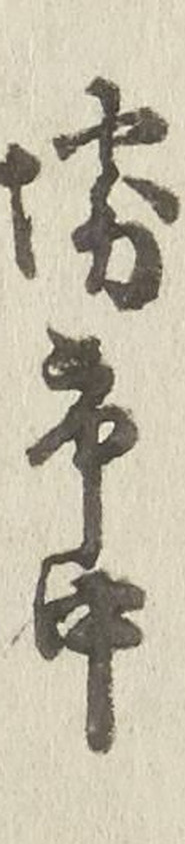堺市中
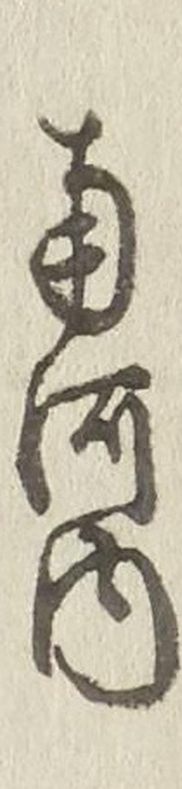南河内
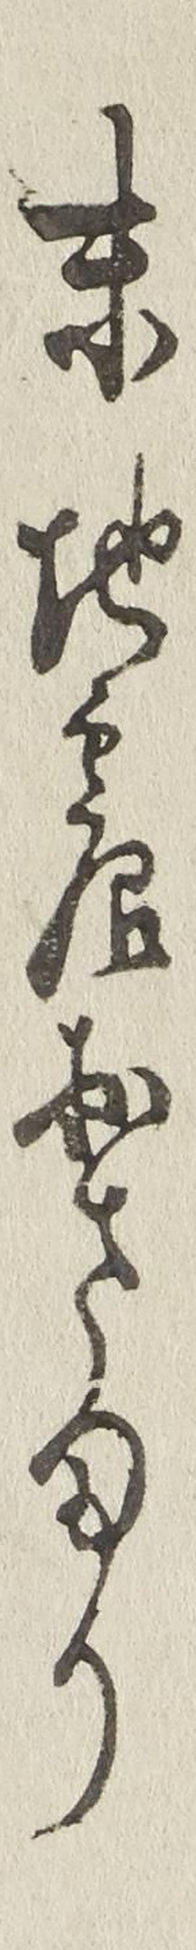末地震おさまり
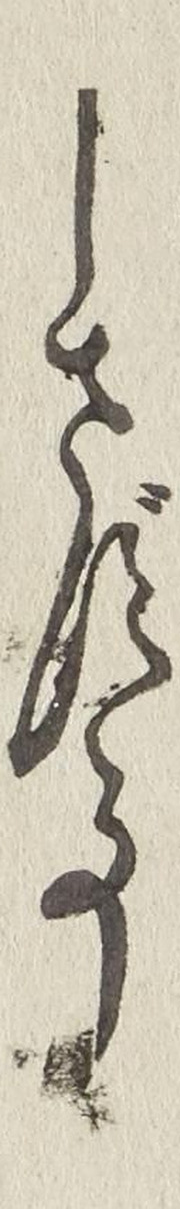しさず事
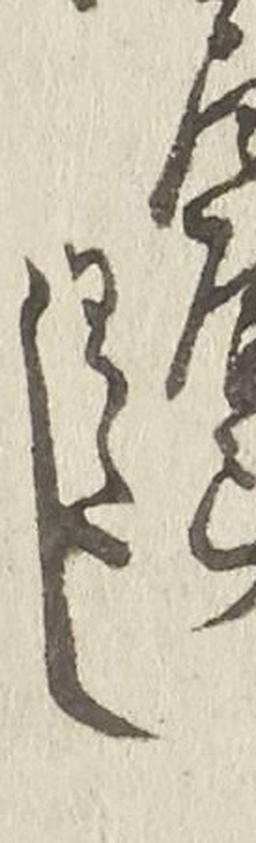くたし
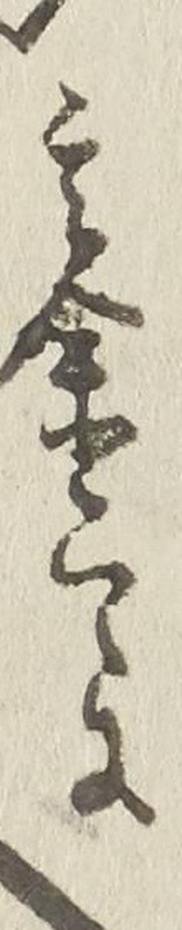其余こゝに
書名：嘉永七甲寅年十一月五日　攝津大津波次第
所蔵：東京大学地震研究所図書室 Earthquake Research Institute Library, The University of Tokyo, JAPAN
